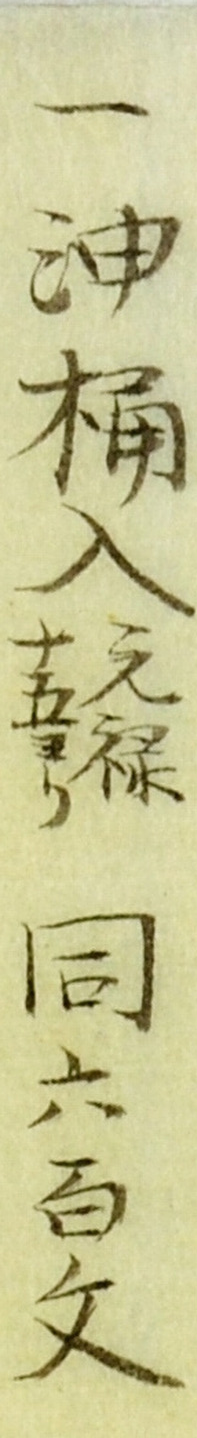一油小桶入同二百文
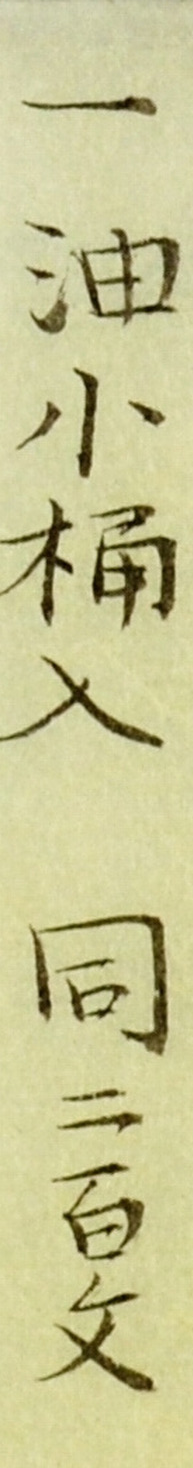一油小桶入同二百文

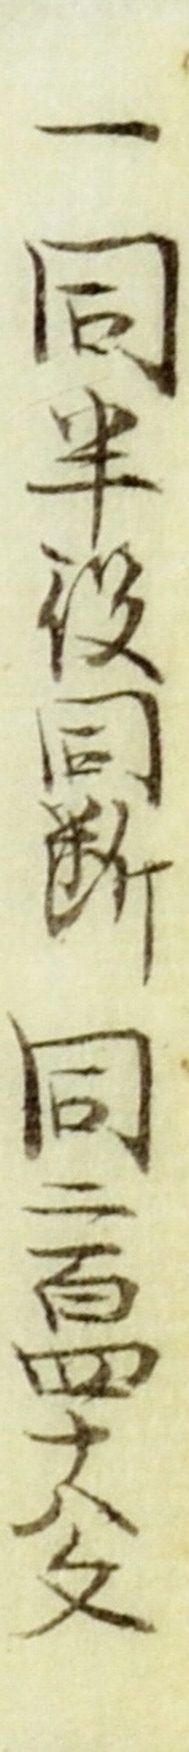一同半役同断同二百四十八文
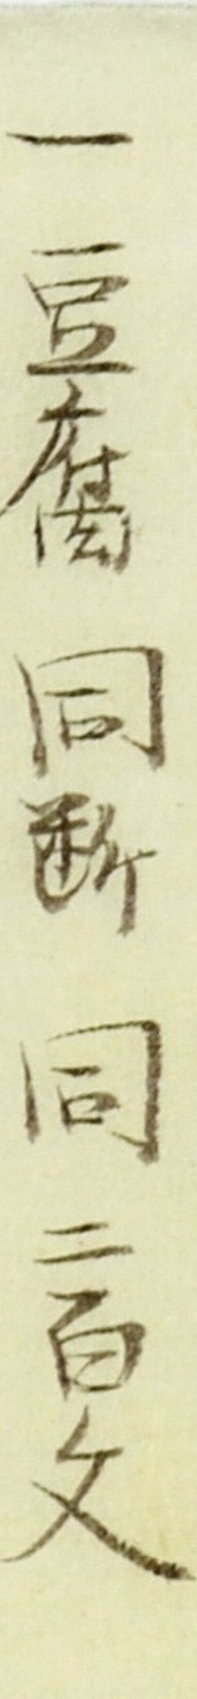一豆腐同断同二百文
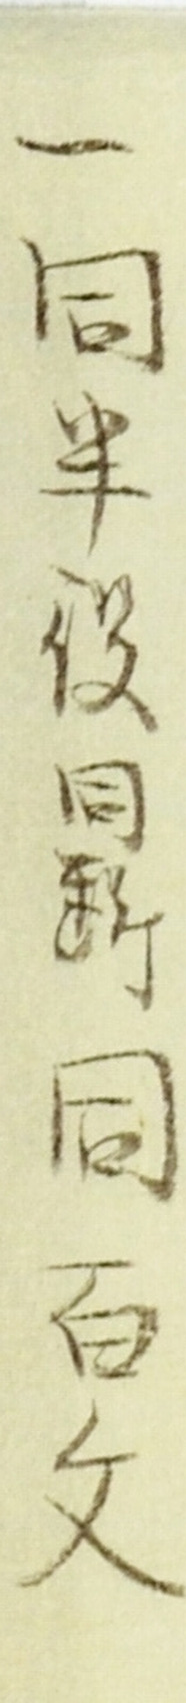一同半役同断同百文
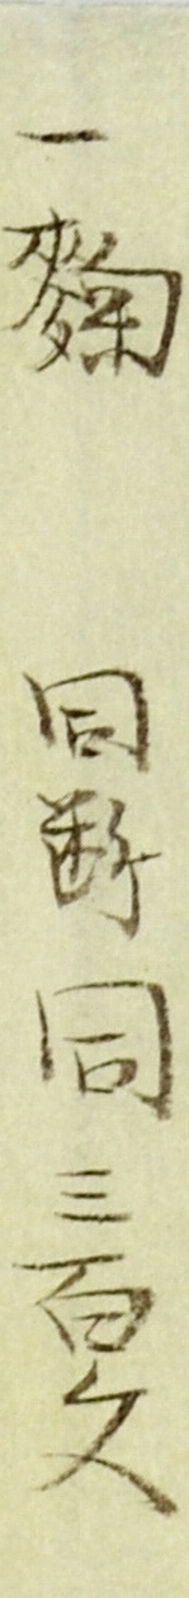一麹同断同三百文
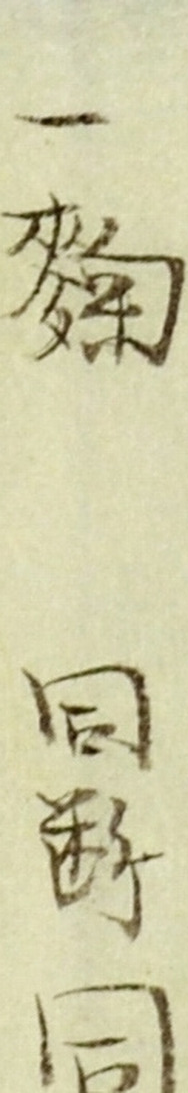一麹同断同三百文
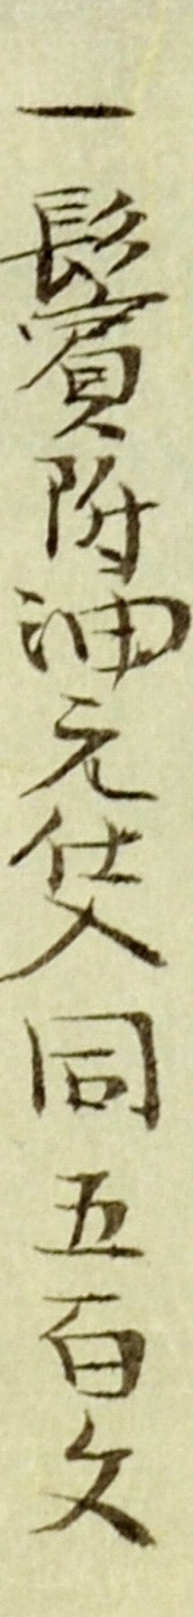一鬢附油元仕入同五百文
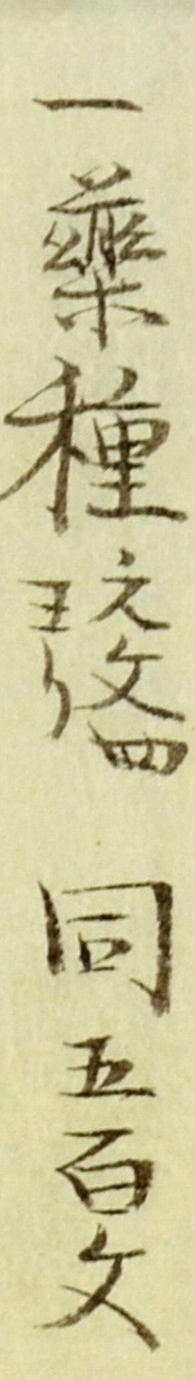一茶商同五百文
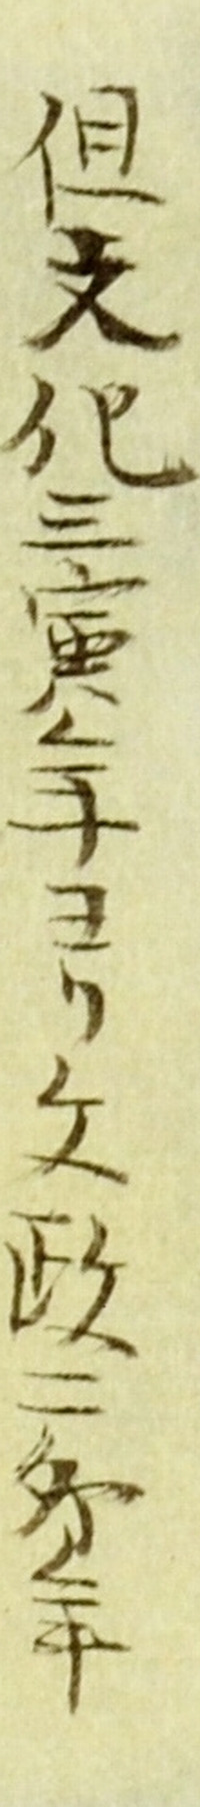但文化三寅年ヨリ文政二卯年
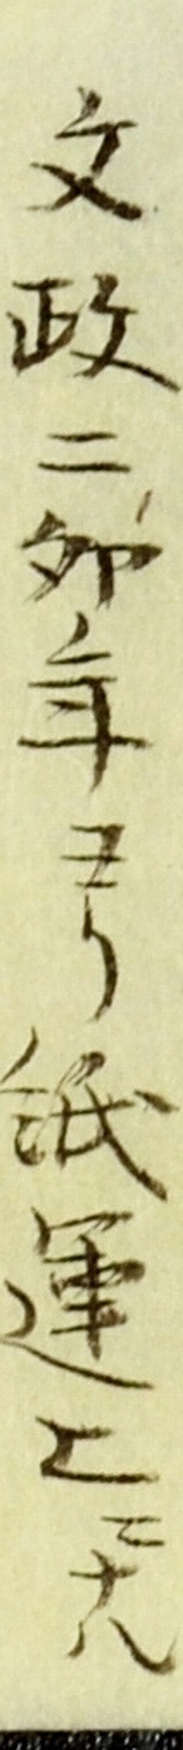文政二卯年ヨリ紙運上二ナル
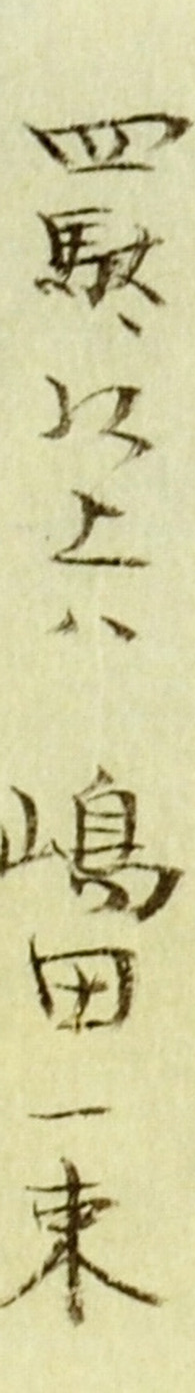四駄以上ハ嶋田一束
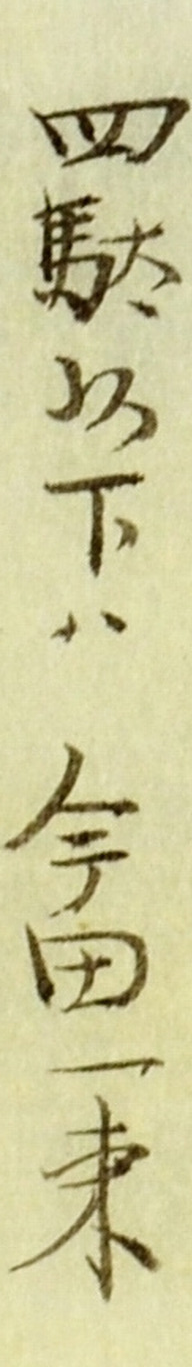四駄以下ハ今田一束
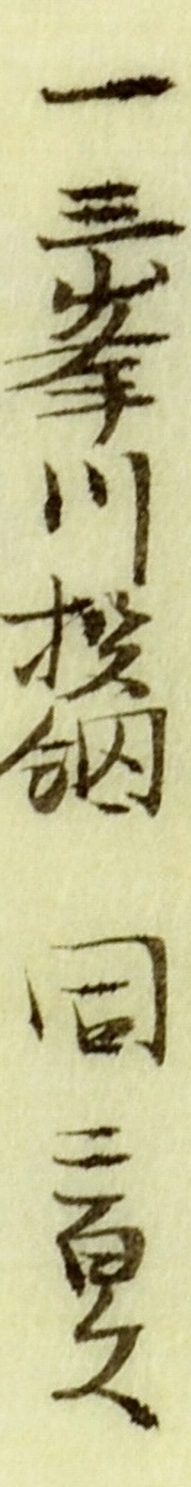一三峯川投網同二百文
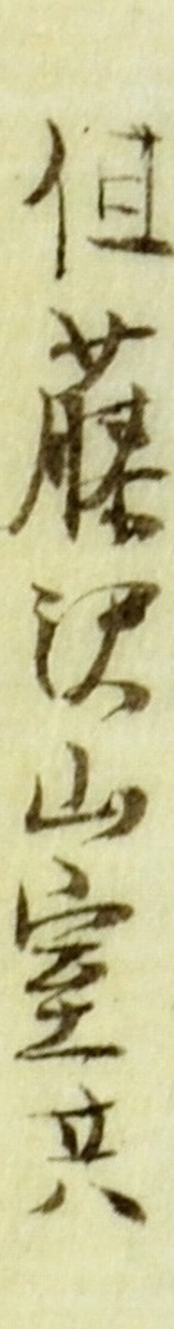但藤沢山室共
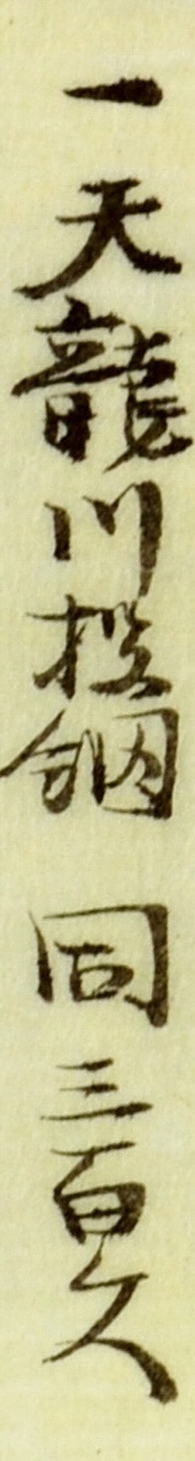一天龍川投網同三百文
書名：分一御定法
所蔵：伊那市立高遠町図書館・合同会社AMANE
